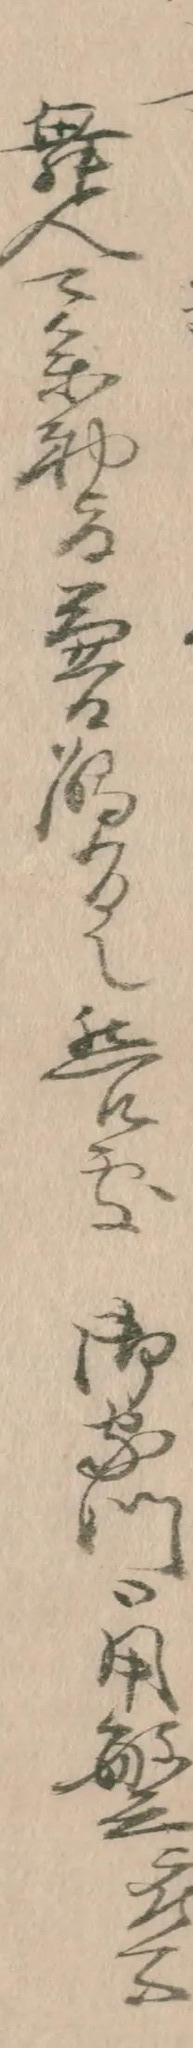舞人可参勤旨兼日触有之然ル處御家門御用繁ニ付不
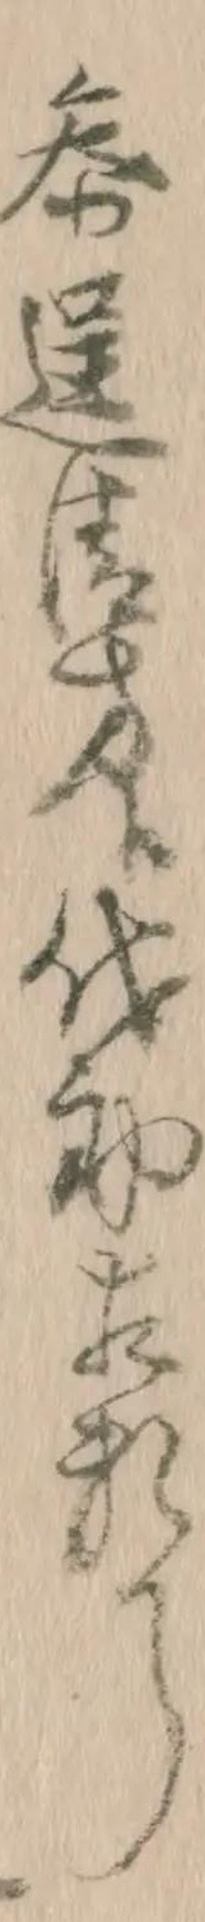参逞清方え代勤相頼了
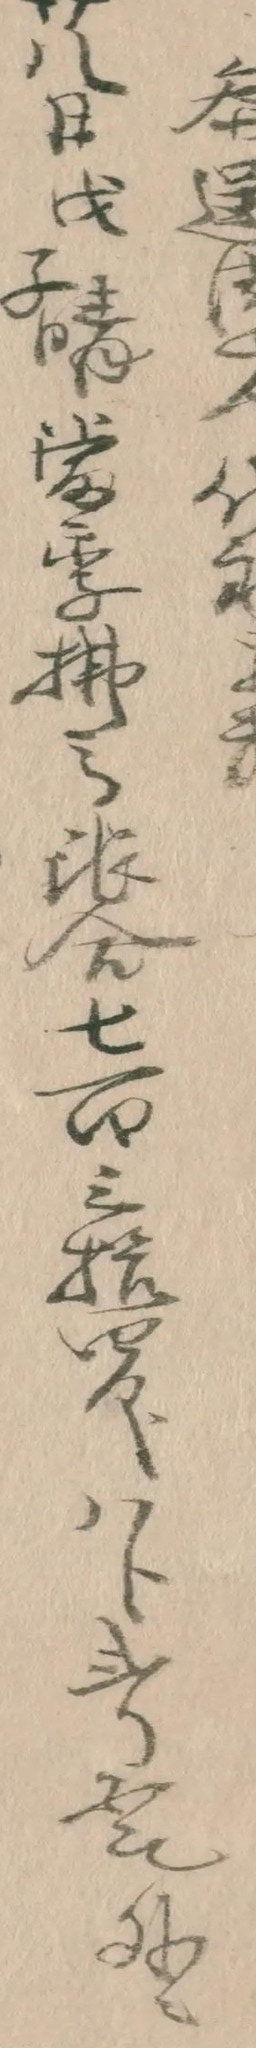廿八日戊子晴當季払高銀合七百三拾四匁八分弐り五毛外ニ
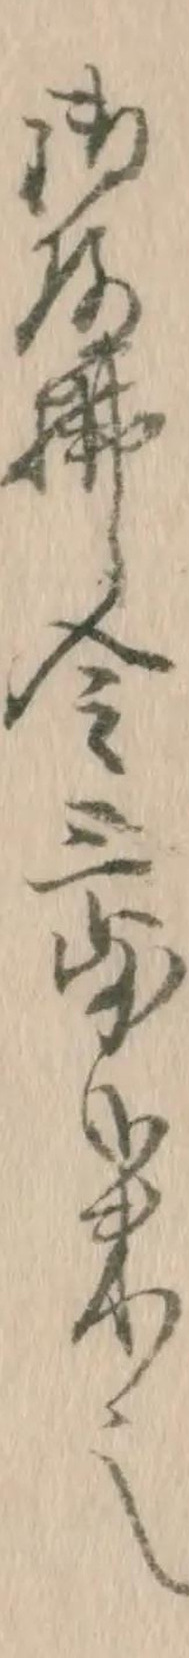御講払合三歩弐朱也
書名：賀茂社記録. 第65冊
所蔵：国立国会図書館 National Diet Library, JAPAN
